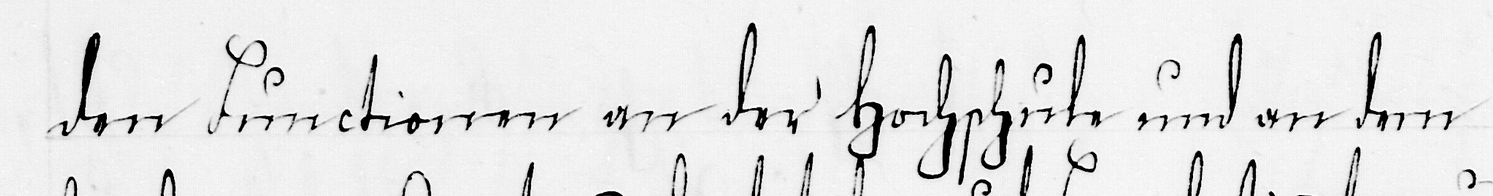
den Functionen an der Hochschule und an dem
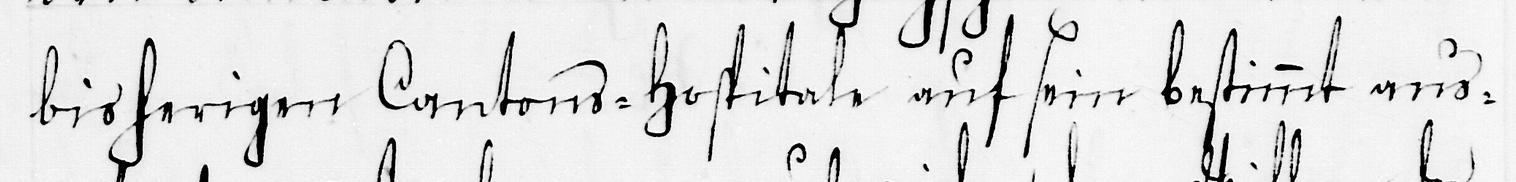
bisherigen Cantons-Hospitale auf sein bestimmt aus¬
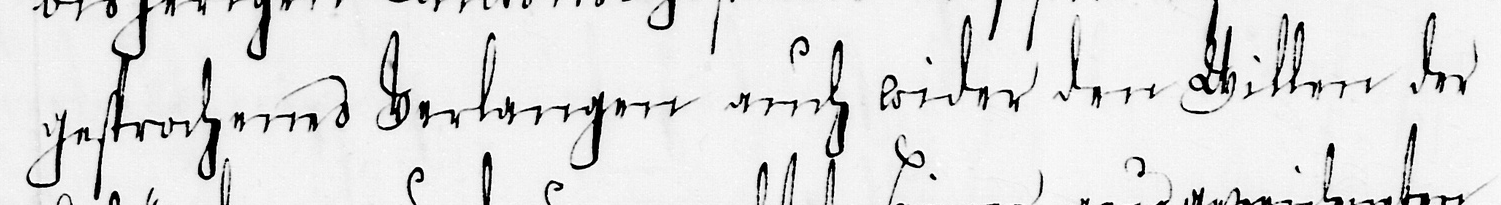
gesprochenes Verlangen auch wider den Willen der
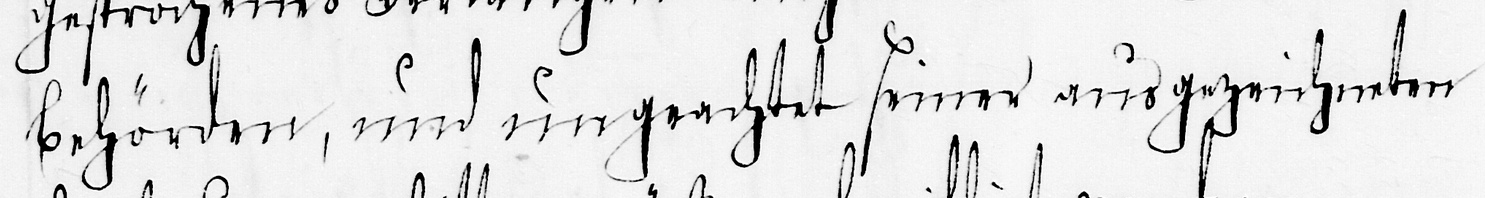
Behörden, und ungeachtet seiner ausgezeichneten
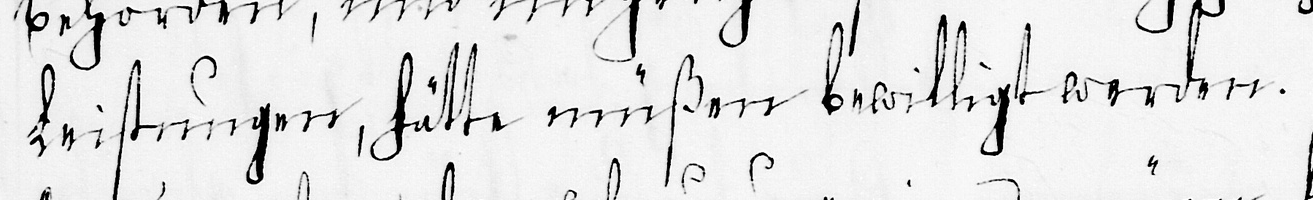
Leistungen, hätte müßen bewilligt werden.
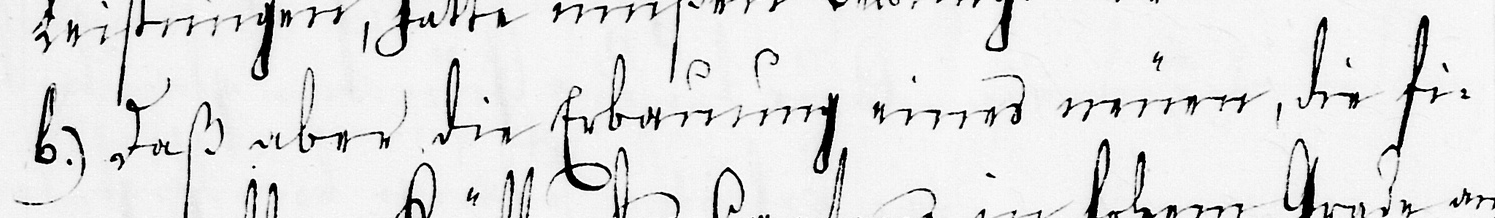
b.) Daß aber die Erbauung eines neuen, die fi¬
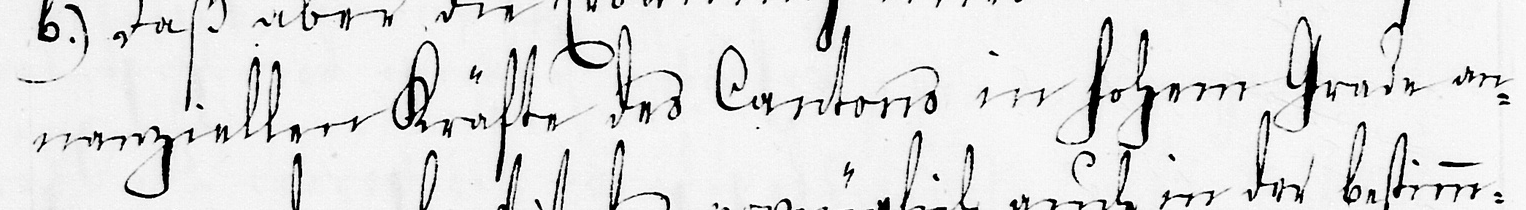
nanziellen Kräfte des Cantons in hohem Grade an¬
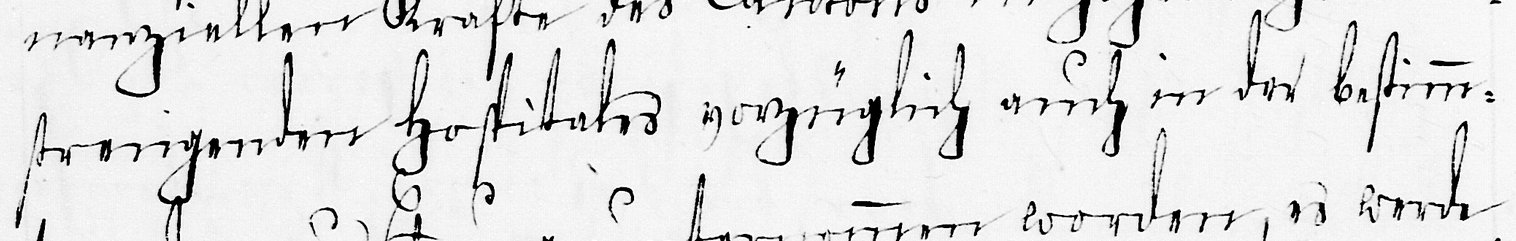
strengenden Hospitales vorzüglich auch in der bestimm¬
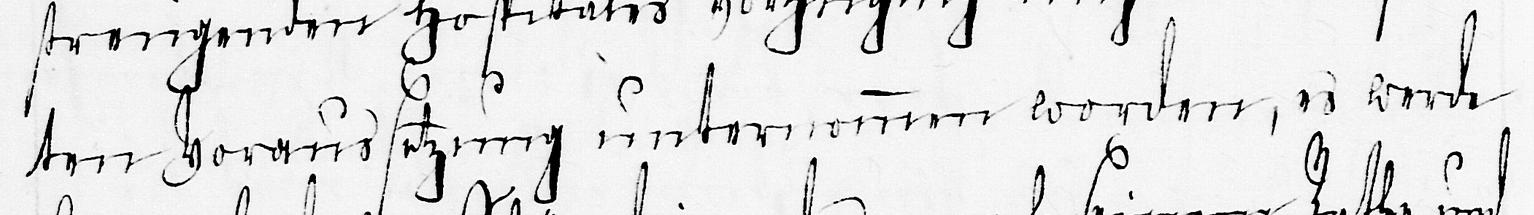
ten Voraussetzung unternommen worden, es werde
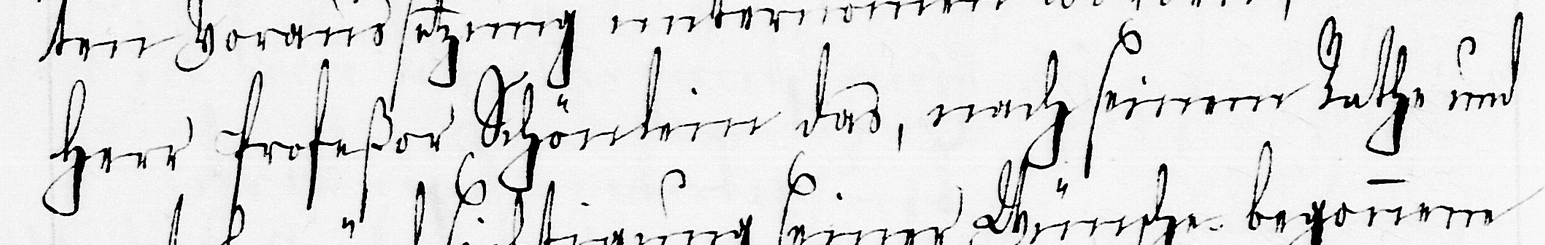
Herr Profeßor Schönlein das, nach seinem Rathe und
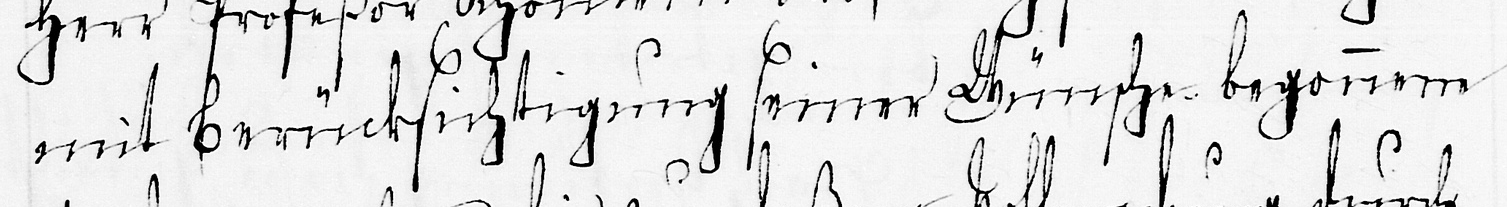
mit Berücksichtigung seiner Wünsche begonnene
